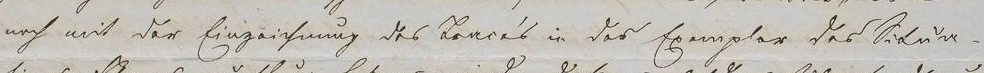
noch mit der Einzeichnung des Tracés in das Exemplar des Situa-
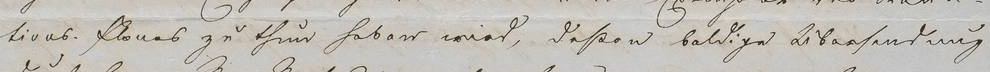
tions-Planes zu thun haben wird, deßen baldige Übersendung
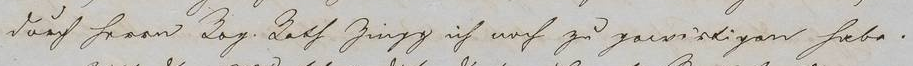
durch Herrn Reg.Rath Zingg ich noch zu gewärtigen habe.
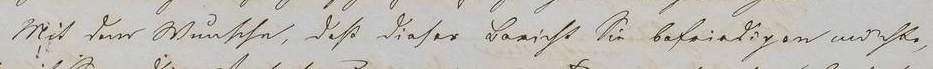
Mit dem Wunsche, daß dieser Bericht Sie befriedigen möchte,
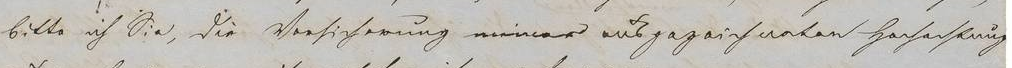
bitte ich Sie, die Versicherung meiner ausgezeichneten Hochachtung
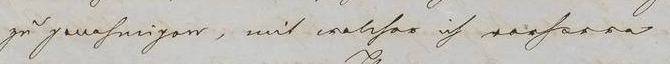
zu genehmigen, mit welcher ich verharre
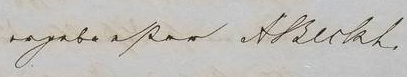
ergebenster A Beckh.
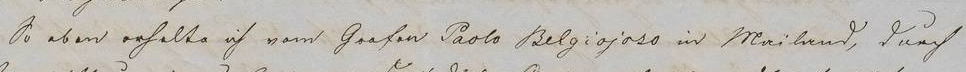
So eben erhalte ich vom Grafen Paolo Belgiojoso in Mailand, durch
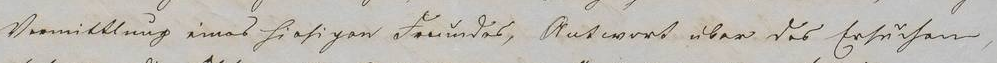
Vermittlung eines hiesigen Freundes, Antwort über das Ersuchen,
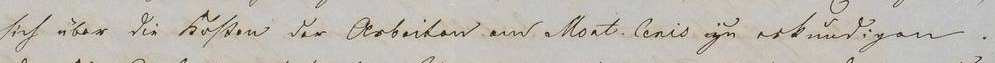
sich über die Kosten der Arbeiten am Mont-Cenis zu erkundigen.
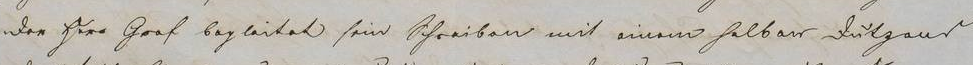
Der Herr Graf begleitet sein Schreiben mit einem halben Dutzend
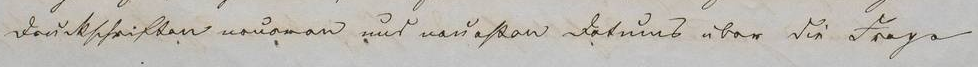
Druckschriften neueren und neuesten Datums über die Frage
